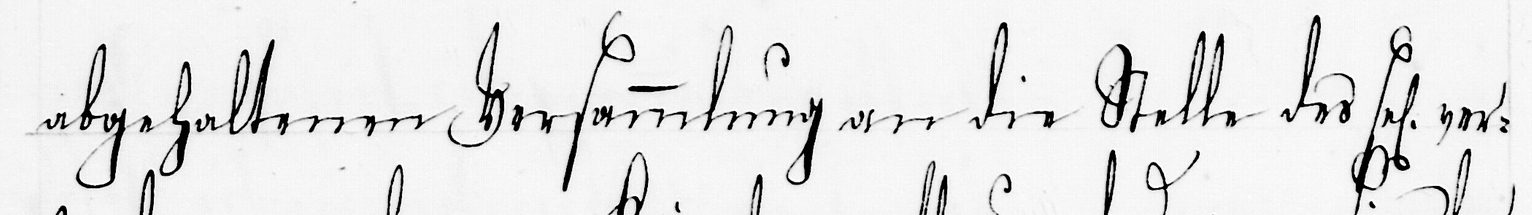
abgehaltenen Versammlung an die Stelle des sel[i¬
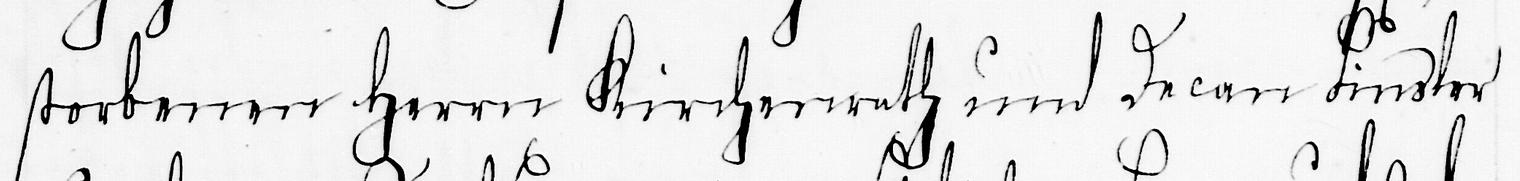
storbenen Herrn Kirchenrath und Decan Finsler
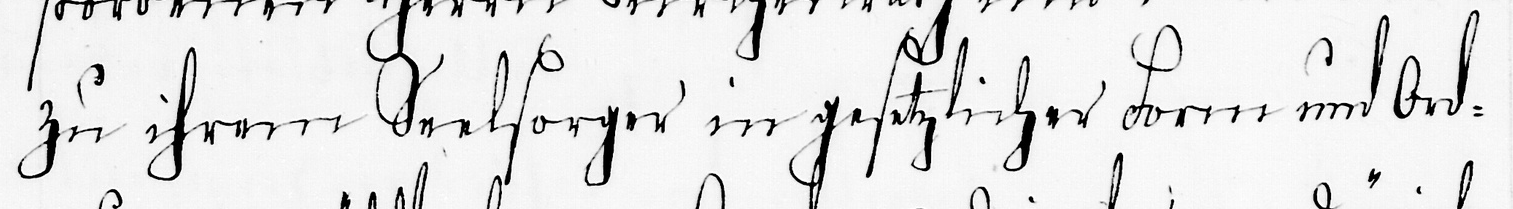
zu ihrem Seelsorger in gesetzlicher Form und Ord¬
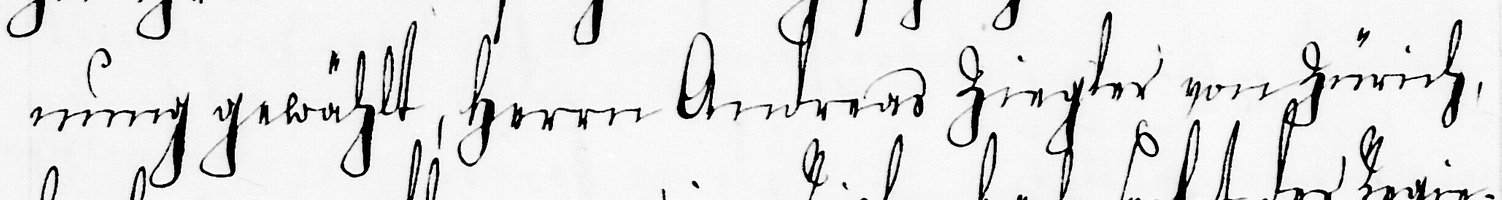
nung gewählt, Herrn Andreas Ziegler von Zürich,
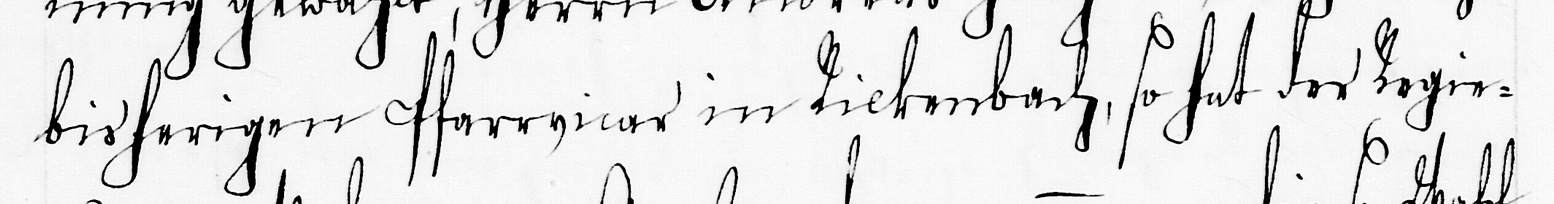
bisherigen Pfarrvicar in Rickenbach, so hat der Regie¬
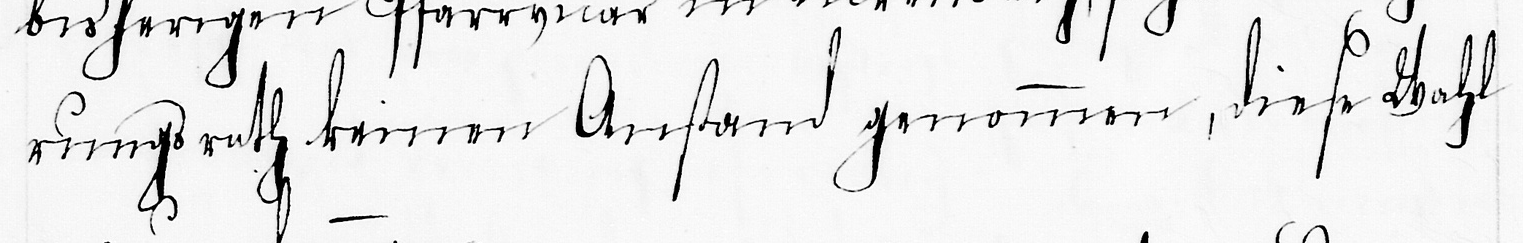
rungsrath keinen Anstand genommen, diese Wahl
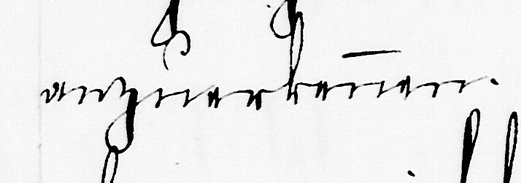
anzuerkennen.
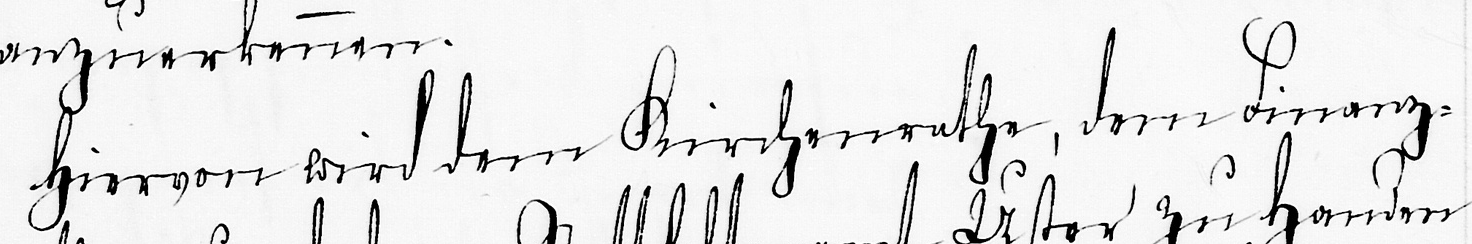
Hiervon wird dem Kirchenrathe, dem Finanz¬
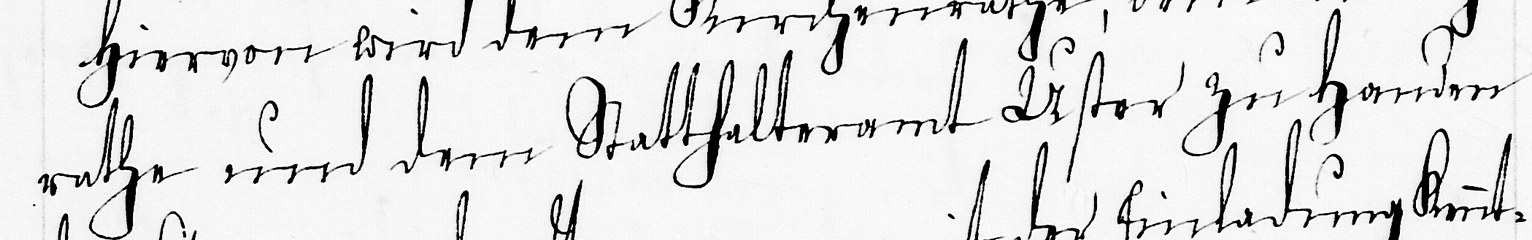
rathe und dem Statthalteramt Uster zu Handen
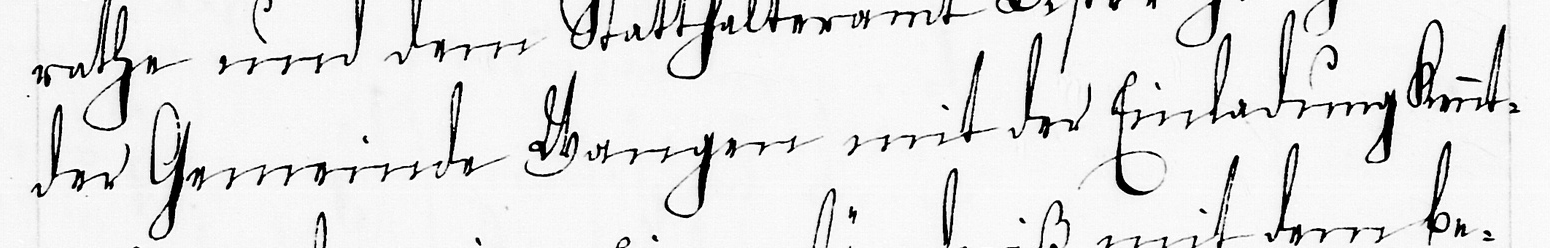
der Gemeinde Wangen mit der Einladung Kenn¬
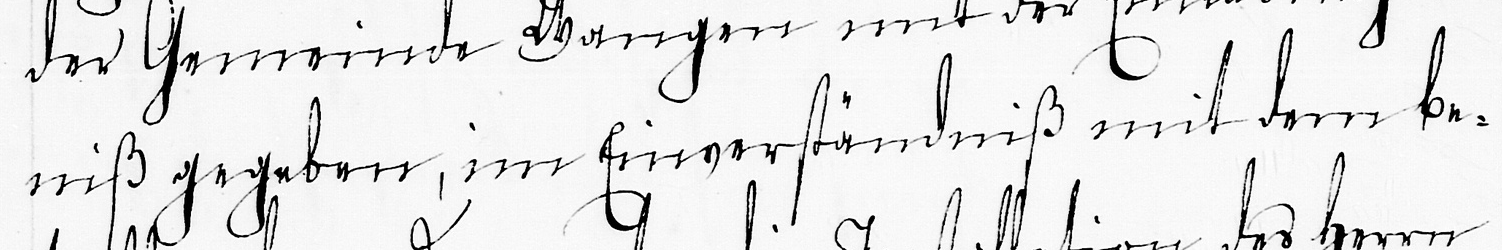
tniß gegeben, im Einverständniß mit dem be¬
